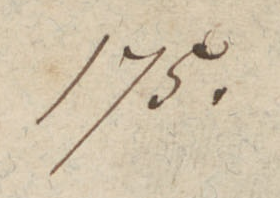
175.
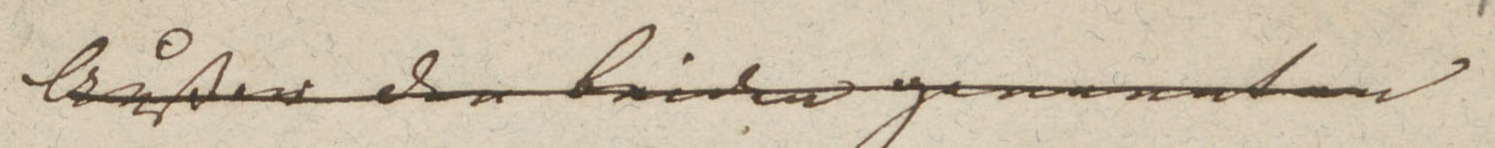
Ausser den beiden genannten
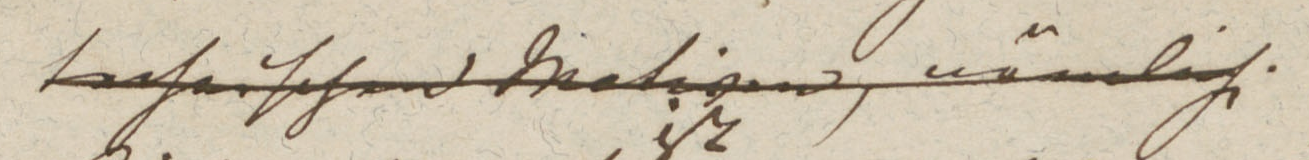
technischen Motiven, nämlich
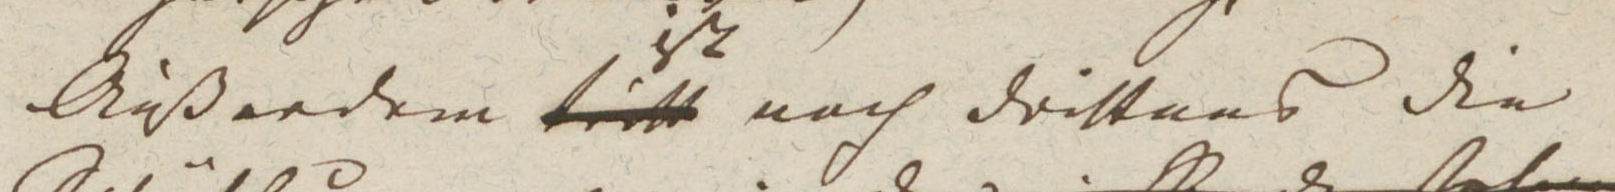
Ausserdem tritt ist noch drittens die
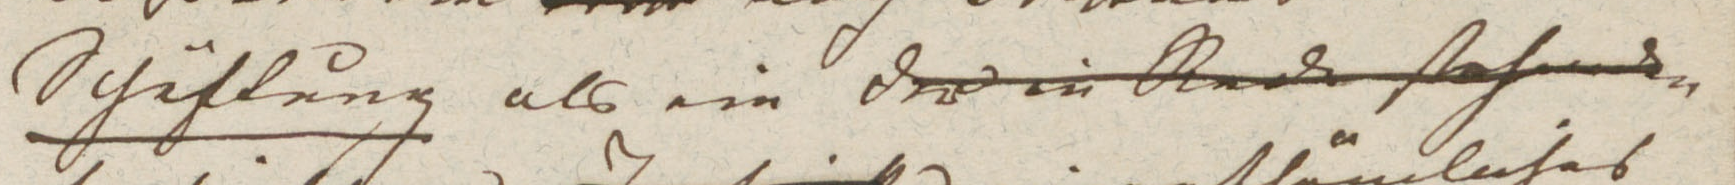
Schäftung als ein der in Rede stehenden
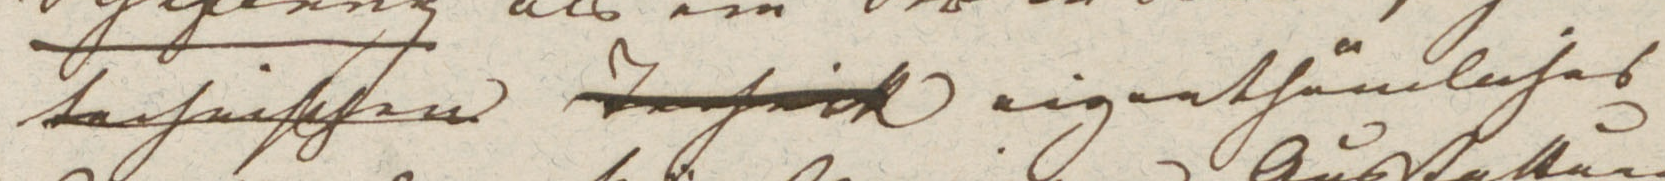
technischen Technik eigenthümliches
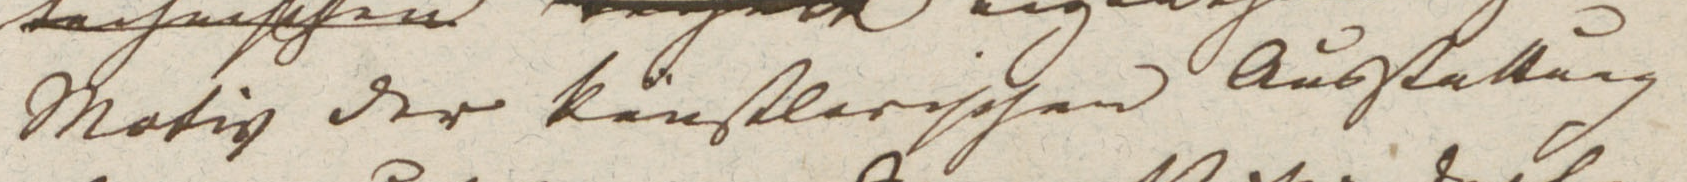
Motiv der künstlerischen Ausstattung
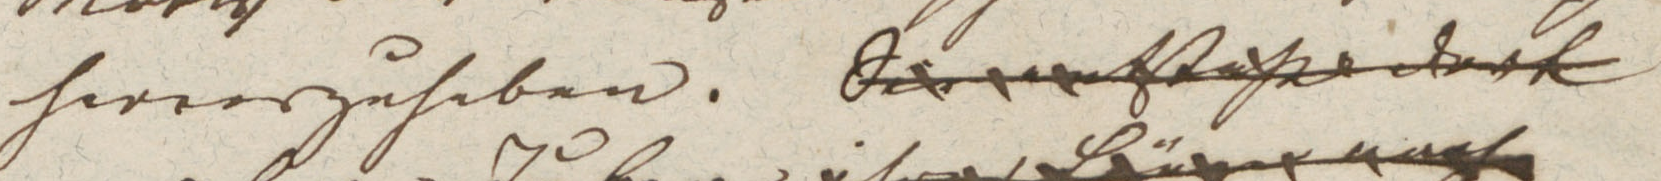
hervorzuheben. Sie entsteht dort
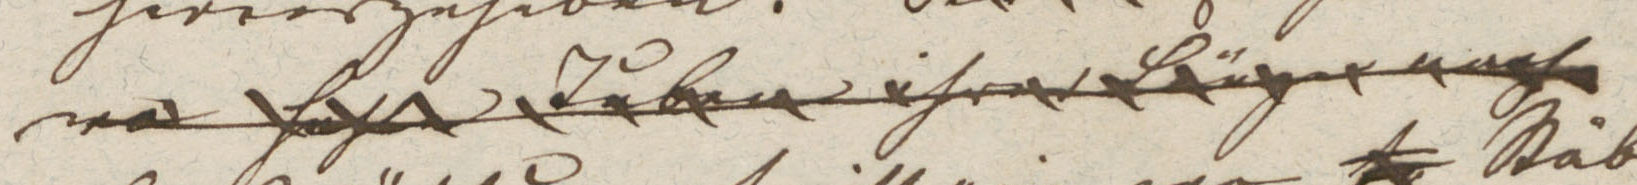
wo hohle Tuben ihrer Länge nach
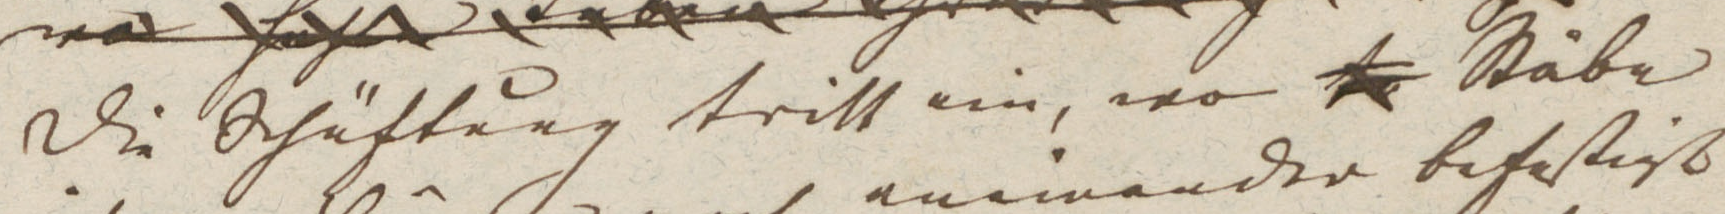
Die Schäftung tritt ein, wo t Stäbe
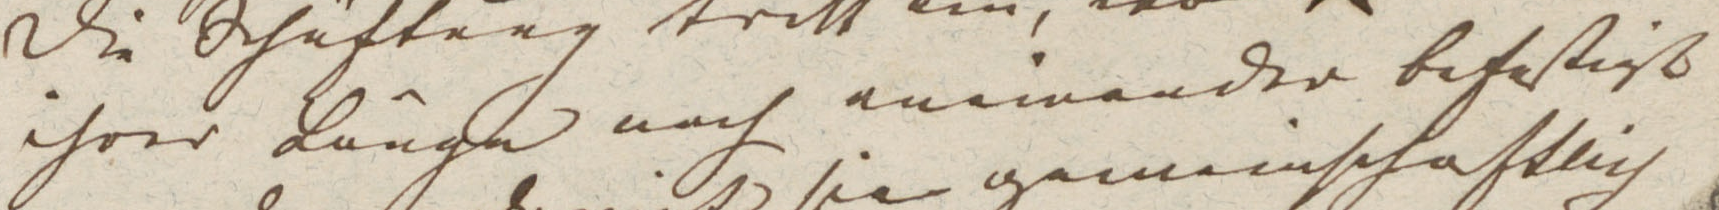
ihrer Länge nach aneinander befestigt
